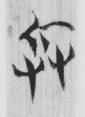兵
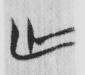亡
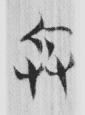兵
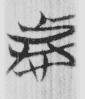者
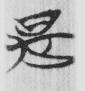是
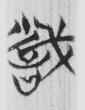{小言戈}
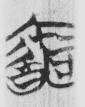{尒䎽}
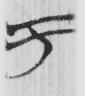于
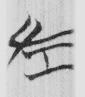左
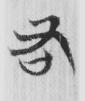右
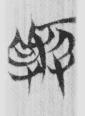與
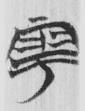𩁹
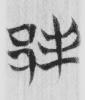邦
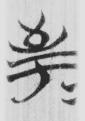{至于}=
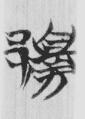{臱阝}
